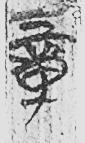章
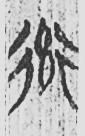率
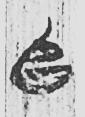𠂤
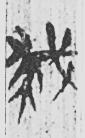{求戈}
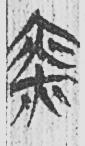赤
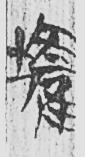{土产隹}
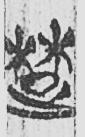楚
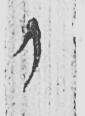人
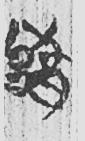豫
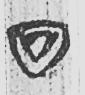回
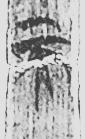而
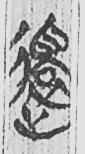還
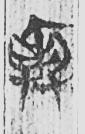與
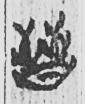晉
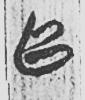𠂤
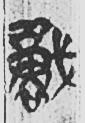戰
